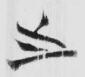之
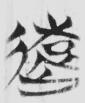遠
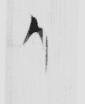人
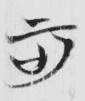可
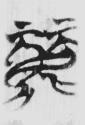麗
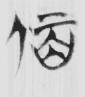{人𠀬}
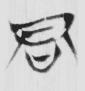君
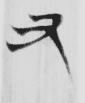又
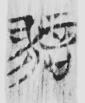{尋言}
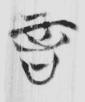言
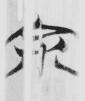余
